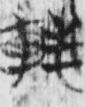軞
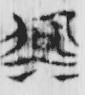登
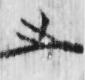之
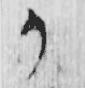人
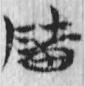○（隋）
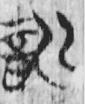訓（順）
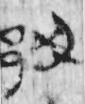○（梁）
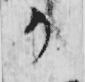人
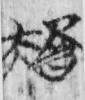○（胡）
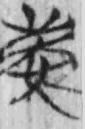慶
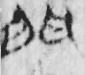門
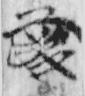婁
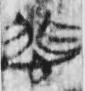悲
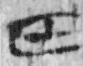甲
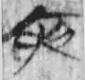寅
